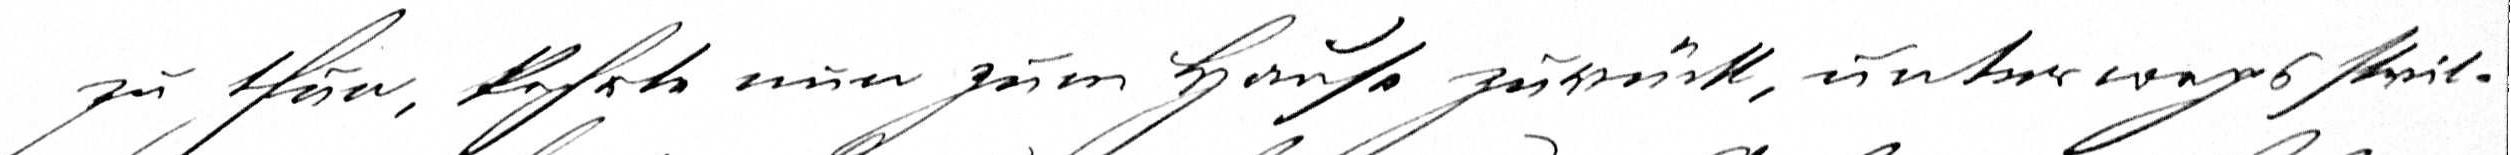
zu thun, kehrte nun zum Hause zurück, unterwegs strit¬
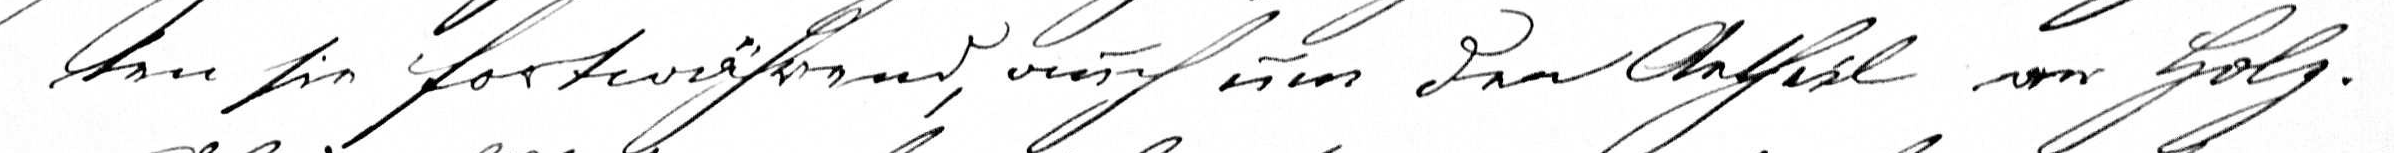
ten sie fortwährend, auch um den Antheil am Holz.
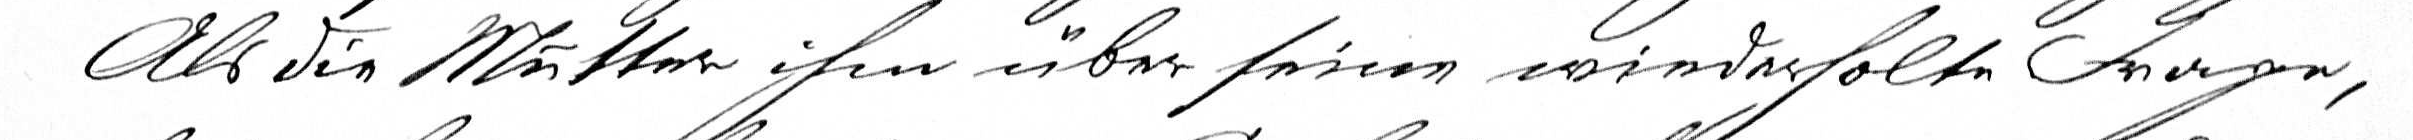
Als die Mutter ihm über seine widerholte Frage,
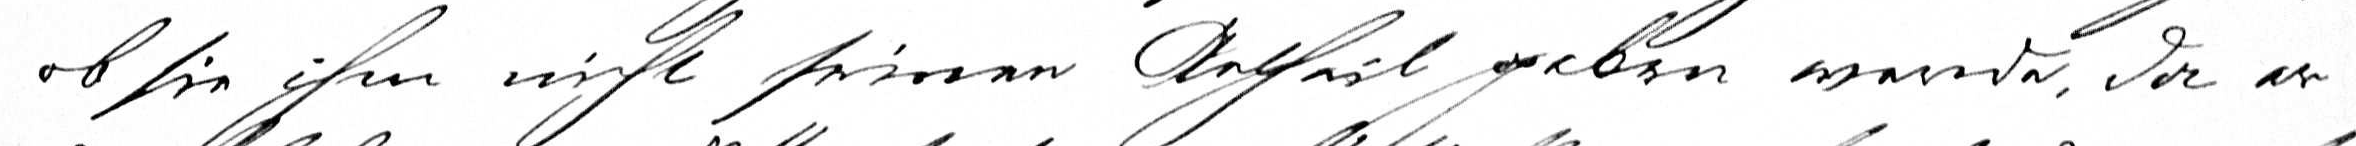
ob sie ihm nicht seinen Antheil geben werde, da er
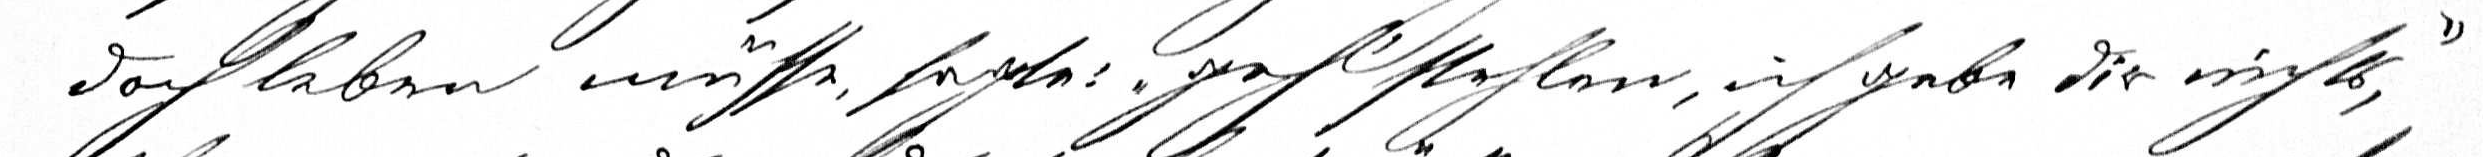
doch leben müsse, sagte: „Geh’ stehlen, ich gebe dir nichts,“
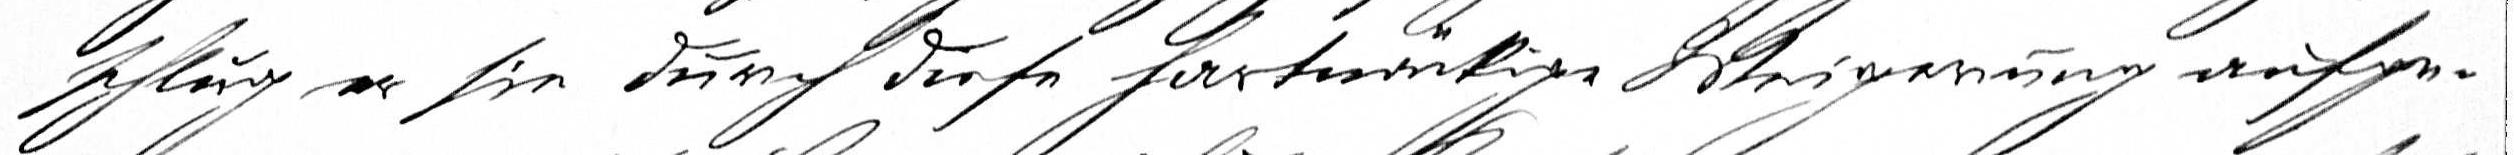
schlug er sie durch diese hartnäckige Weigerung aufge¬
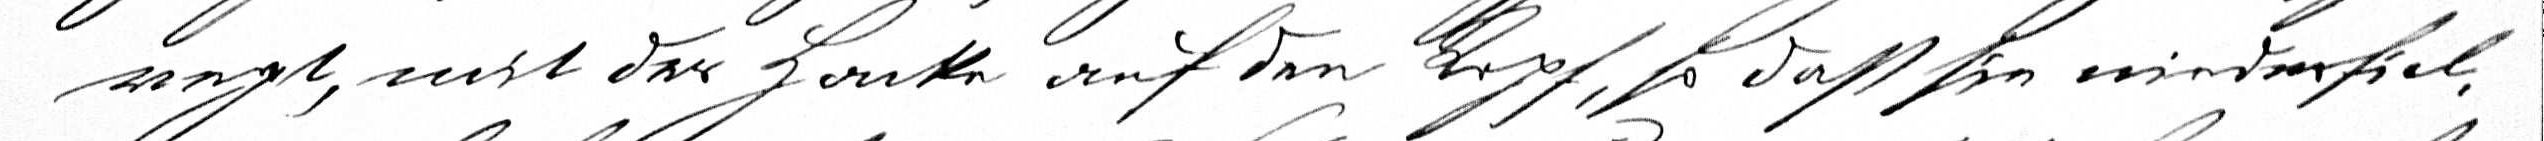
regt, mit der Hacke auf den Kopf, so daß sie niederfiel,
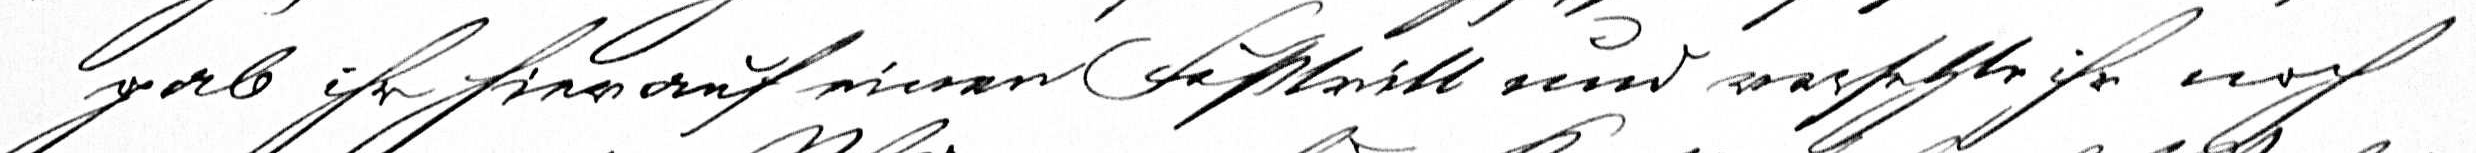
gab ihr hierauf einen Fußtritt und versetzte ihr noch
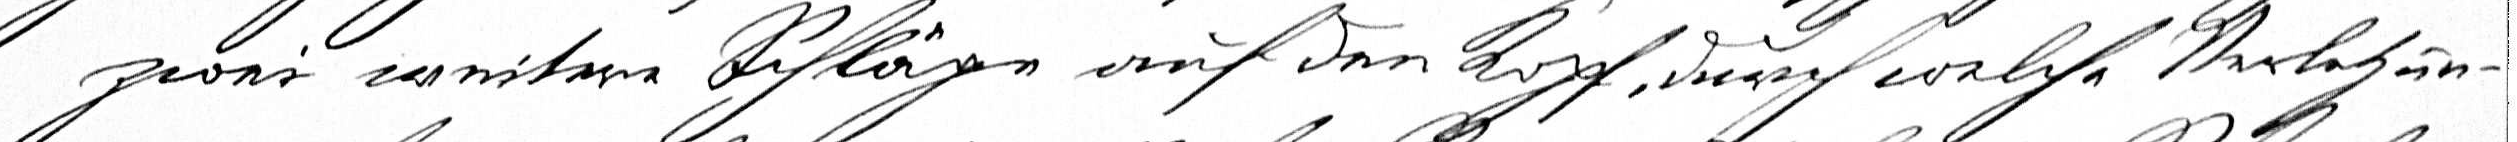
zwei weitere Schläge auf den Kopf, durch welche Verletzun¬
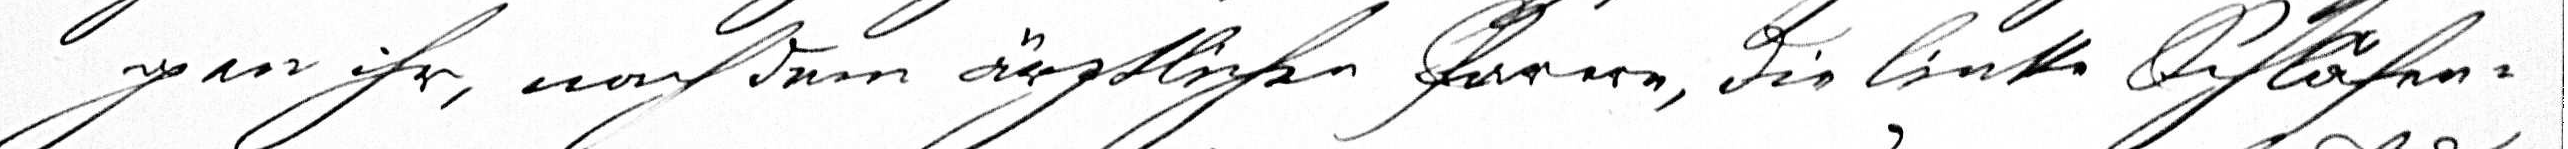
gen ihr, noch dem ärztlichen Parere, die linke Schläfen¬
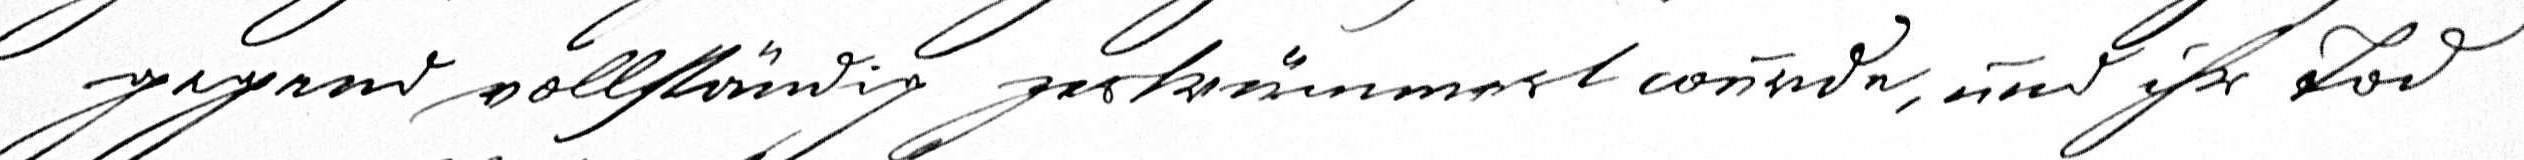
gegend vollständig zertrümmert wurde, und ihr Tod
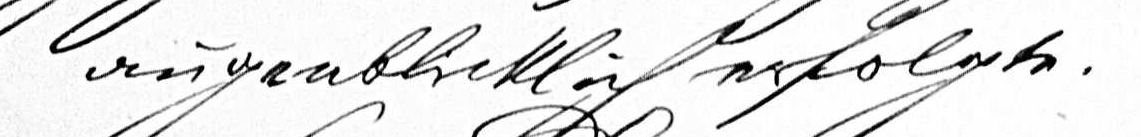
augenblicklich erfolgte.
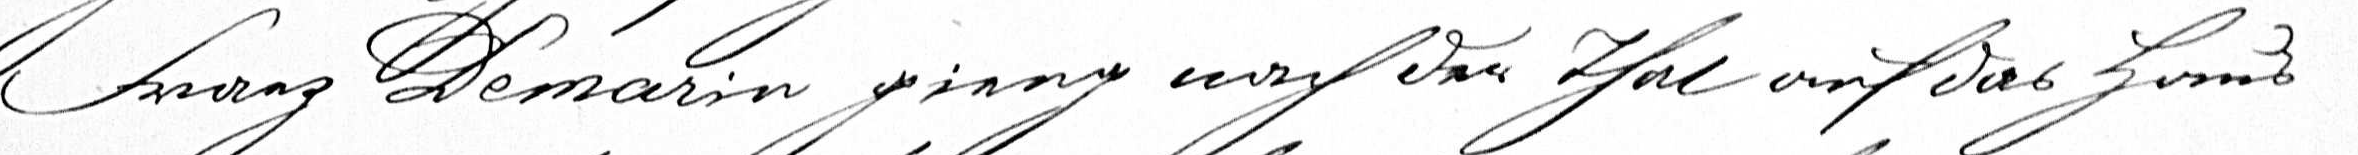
Franz Demarin gieng nach der That auf das Haus
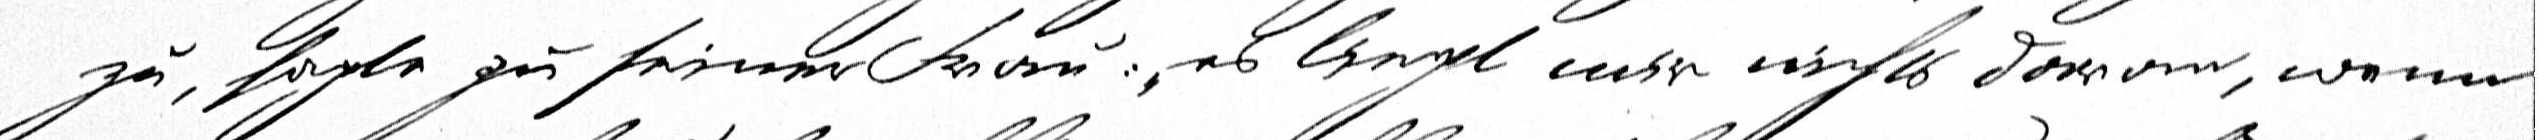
zu, sagte zu seiner Frau: „es liegt mir nichts daran, wenn
